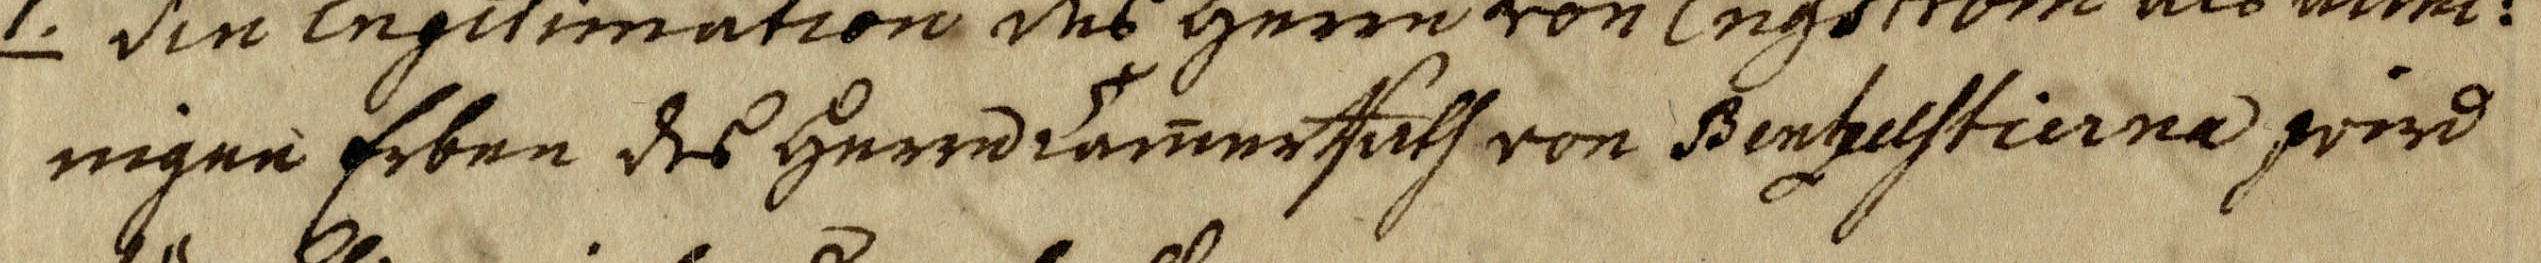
nigen Erben des Herrn CamerRath von Bentzelstierna wird
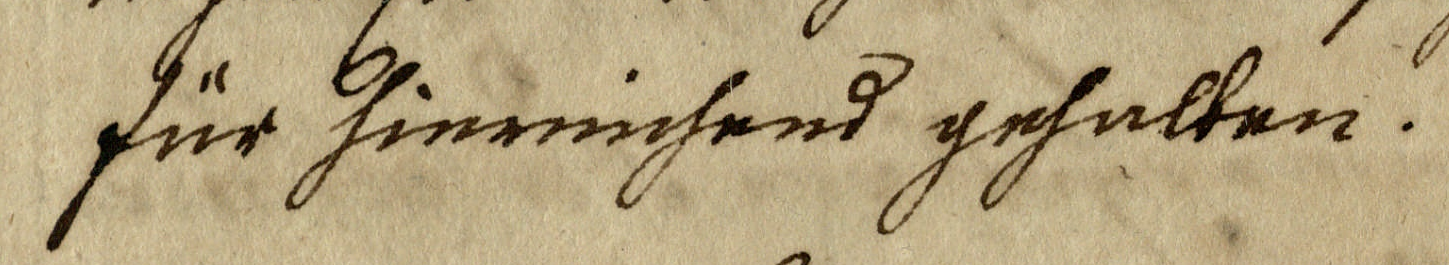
für hinreichend gehalten.
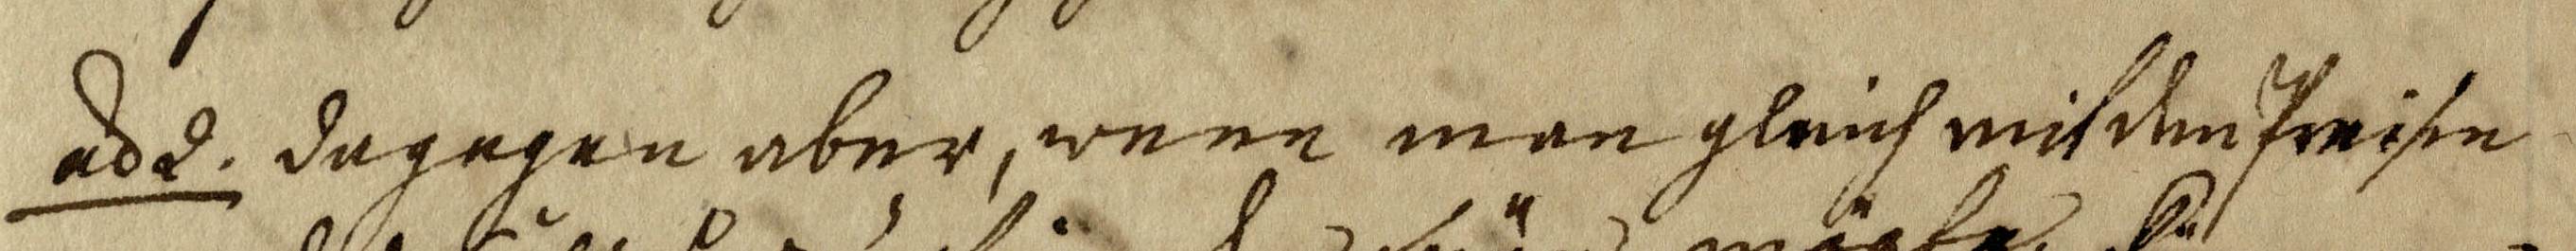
ad 2. dagegen aber, wenn man gleich mit den Preisen
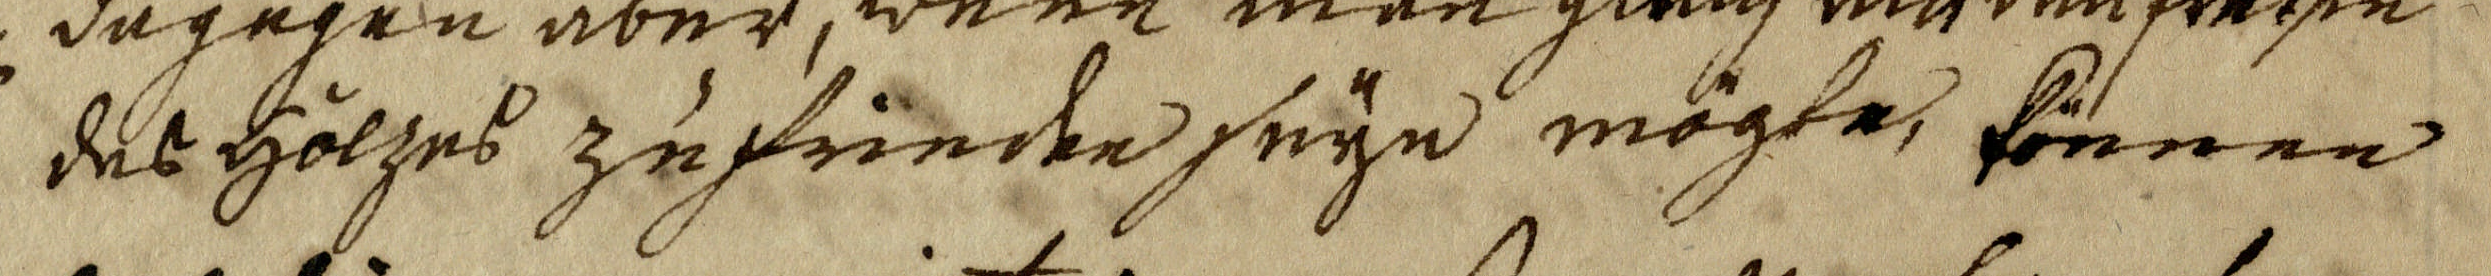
des Holzes zufrieden seÿn mögte, können
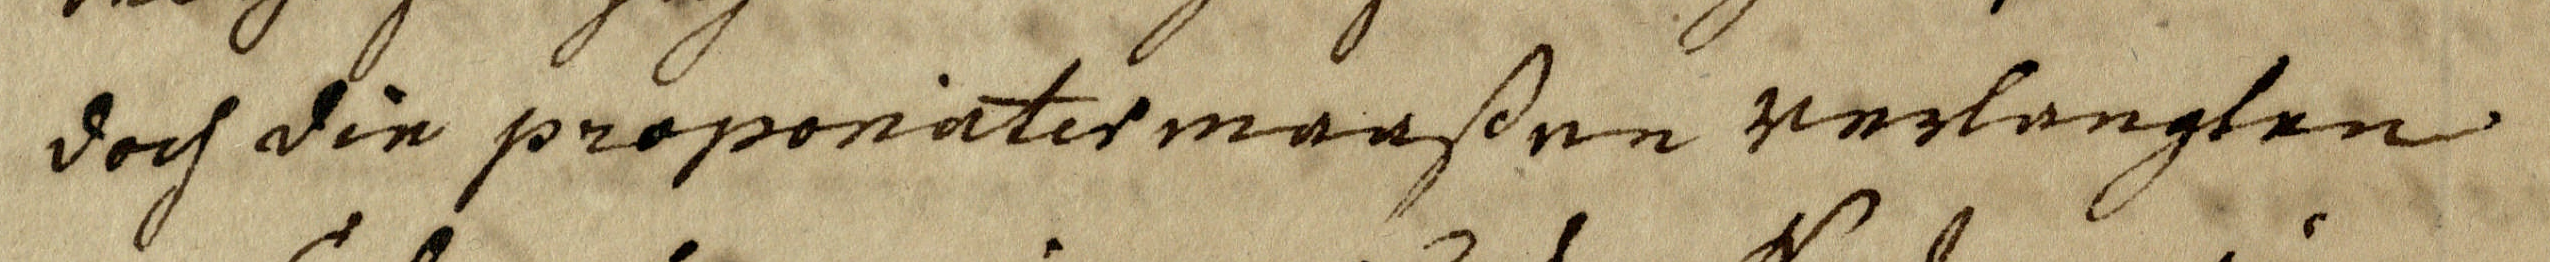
doch die proponirter maaßen verlangten
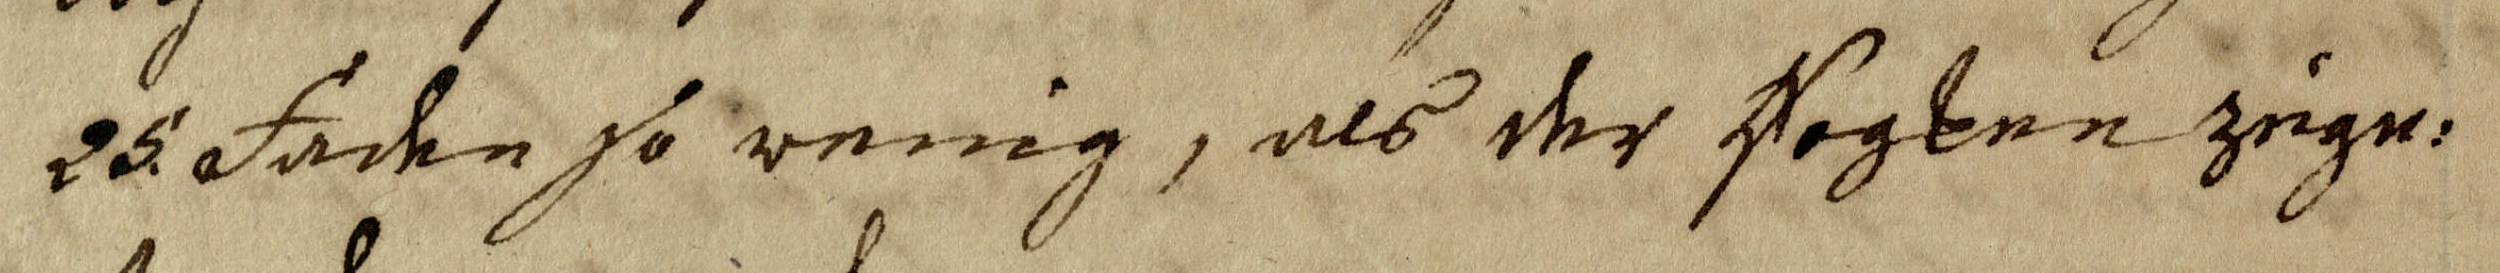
25 Faden so wenig, als der Rogken zuge¬
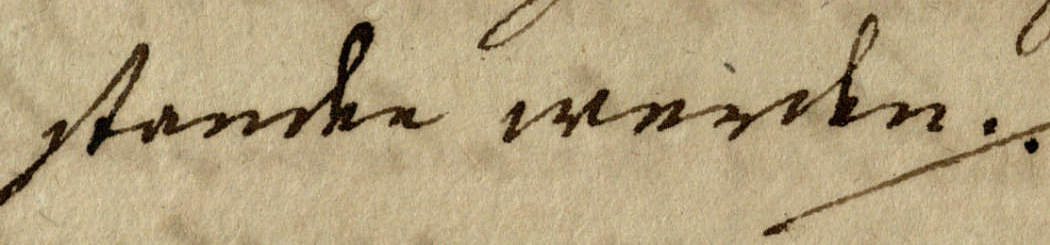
standen werden.
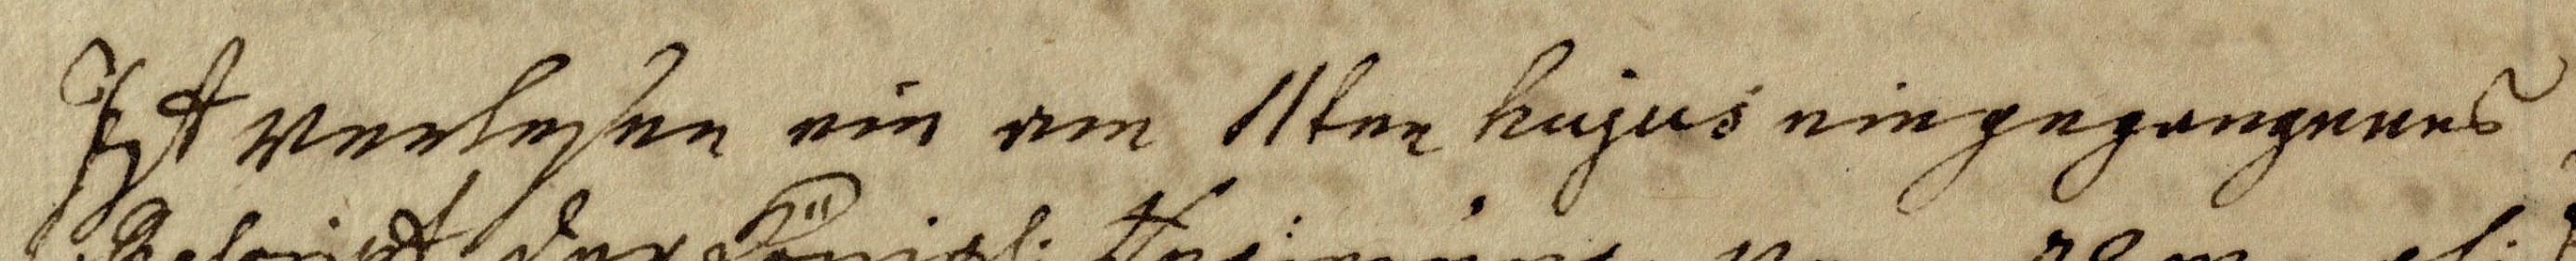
Ist verlesen ein am 11 ten hujus eingegangenes
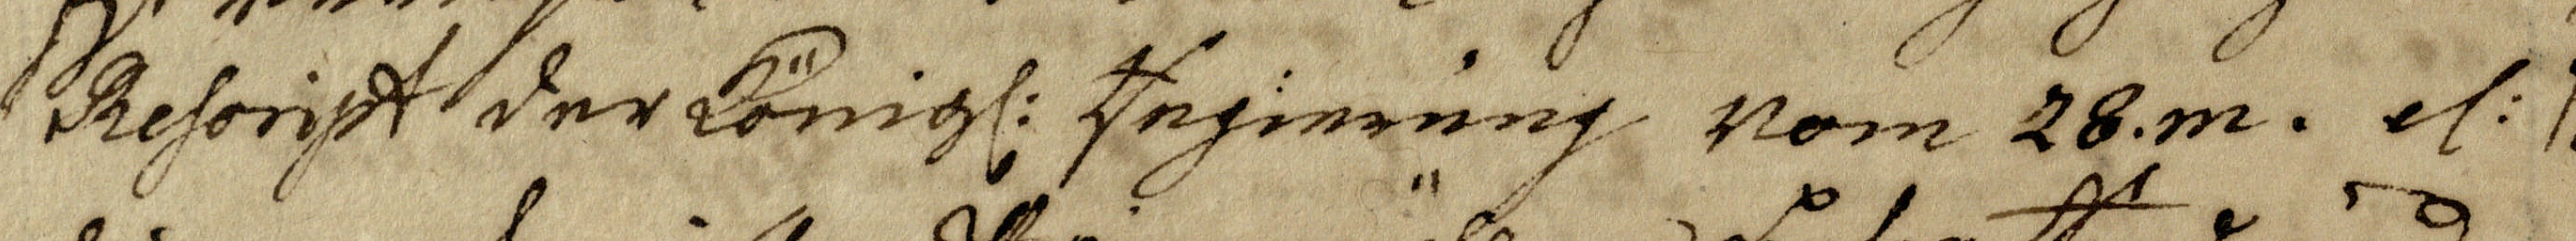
Rescript der Königl. Regierung vom 28 m. el.
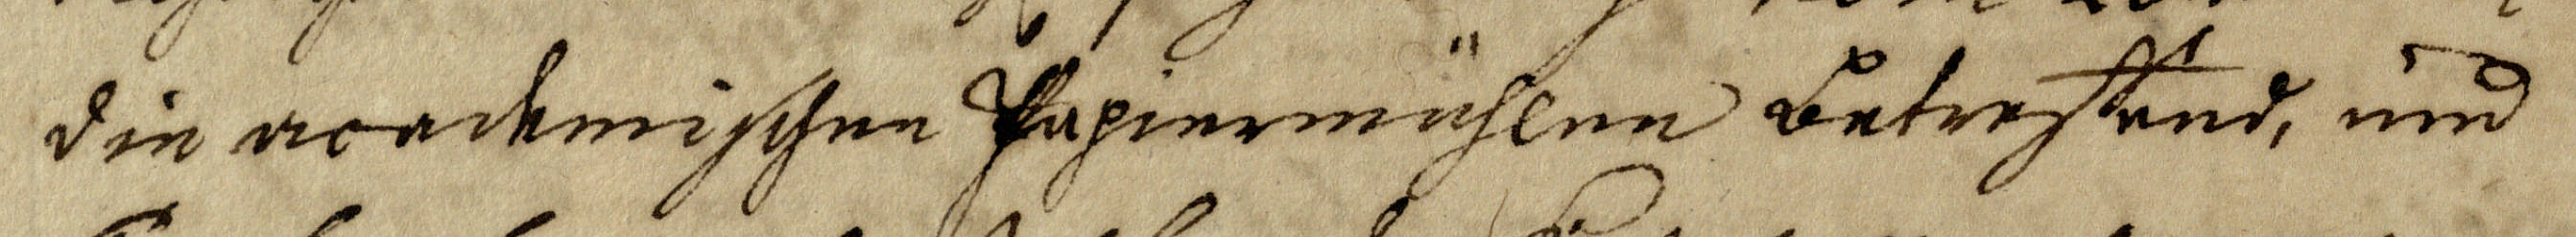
die academischen Papiermühlen betreffend, und
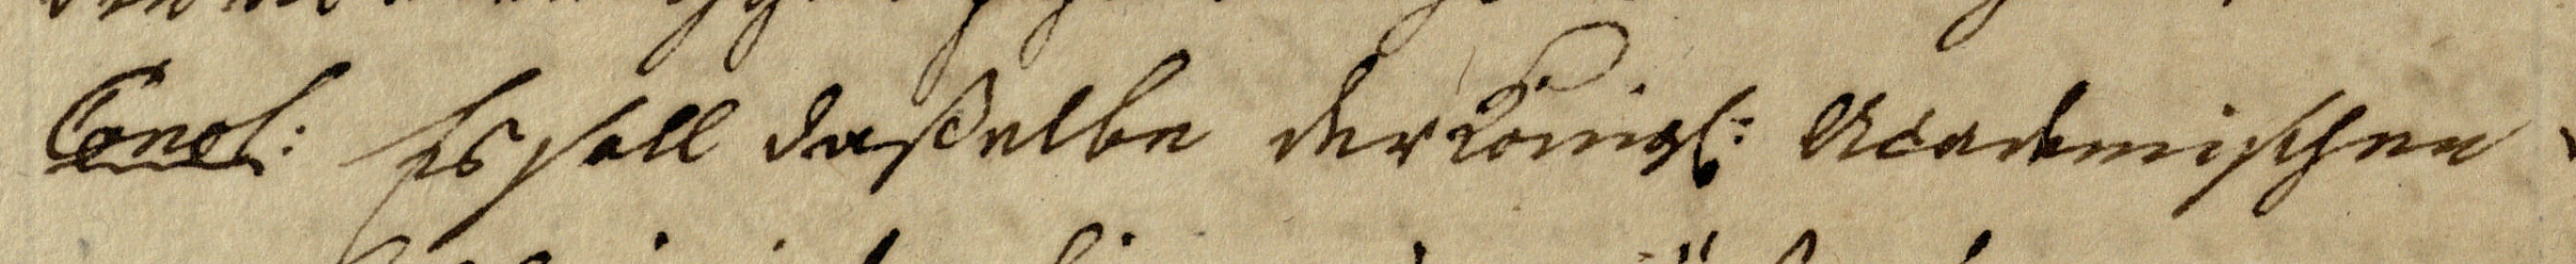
Concl. Es soll daßelbe der Königl. Akademischen
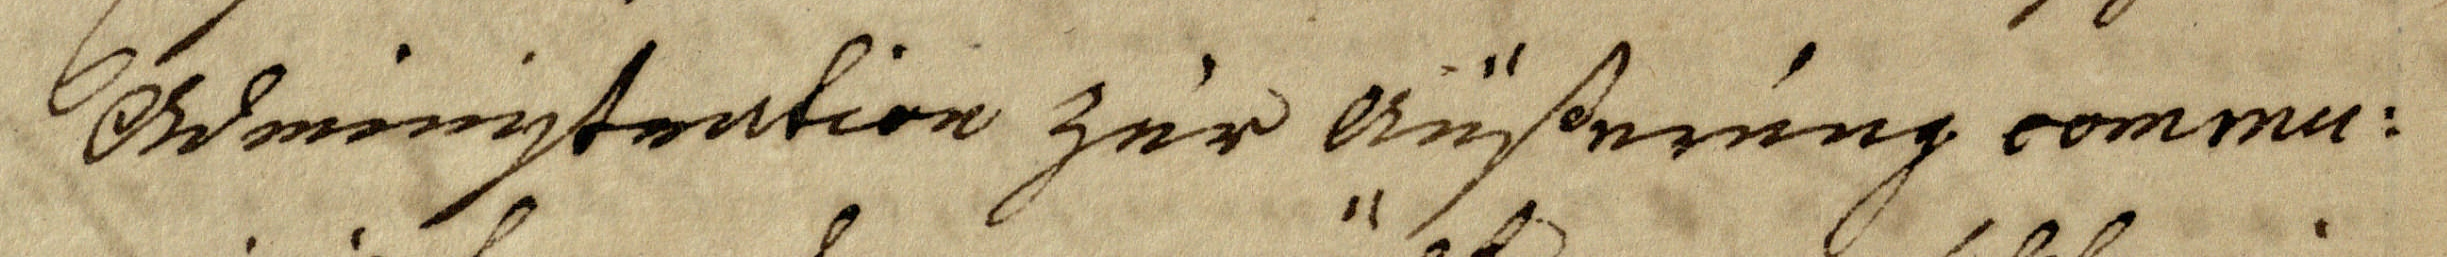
Administration zur Äußerung commu¬
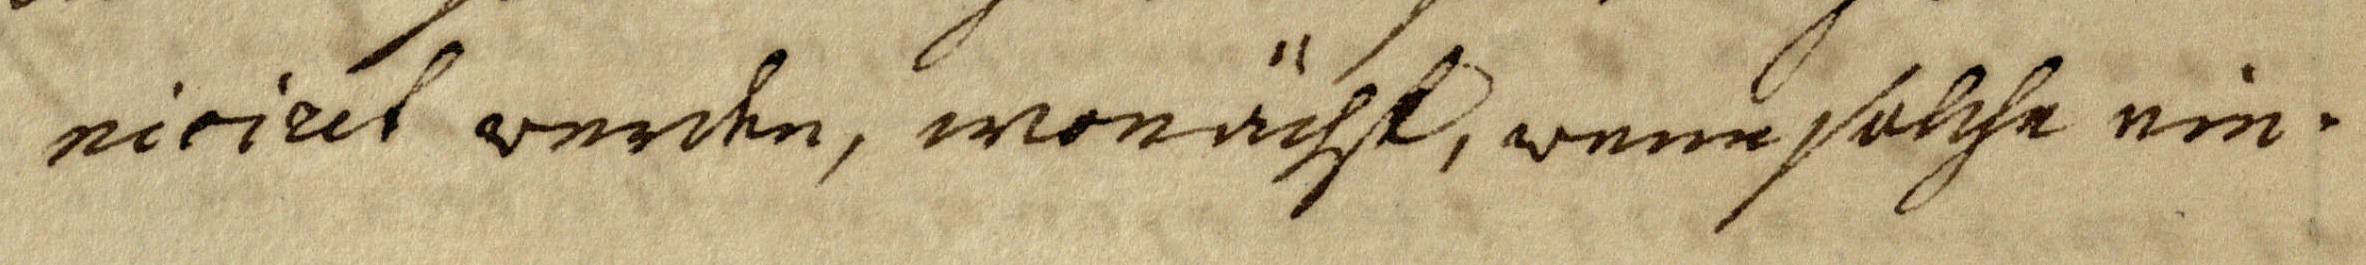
niciret werden, wonächst, wenn solche ein¬
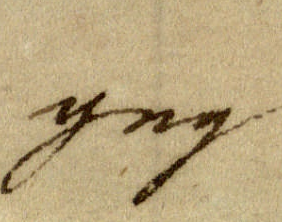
geg
